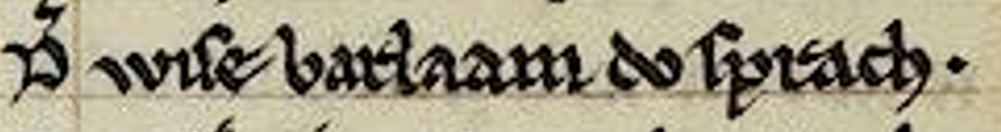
D(er) wiſe barlaam do ſprach.
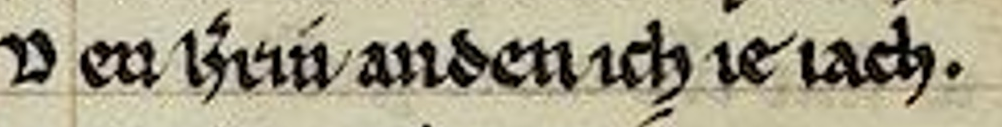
Den h(er)rin anden ich ie iach.
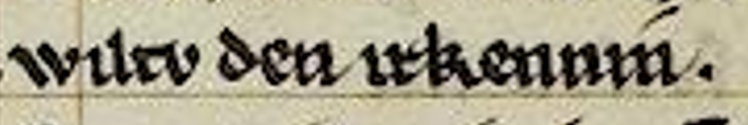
wiltv den irkennin.
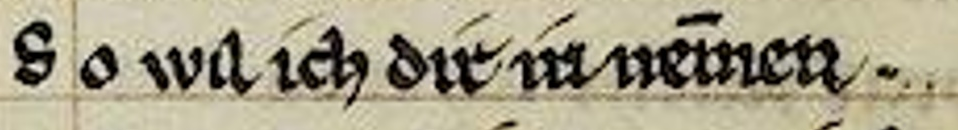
So wil ich dir in ne(m)men.
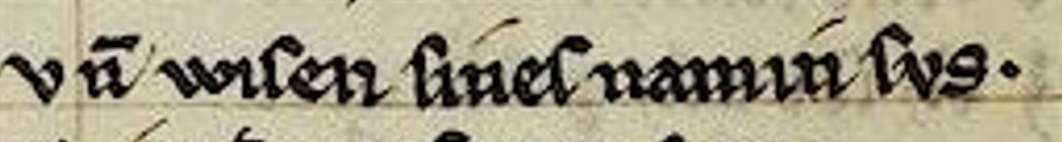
Vn(d) wiſen ſineſ namin ſvs.
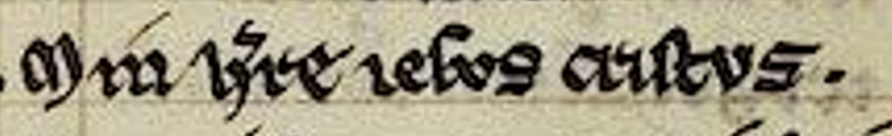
Min h(er)re ieſvs criſtvs.
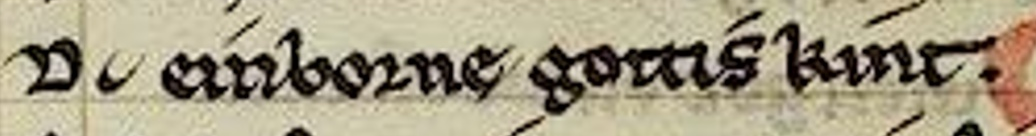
D(az) einborne gottis kint.
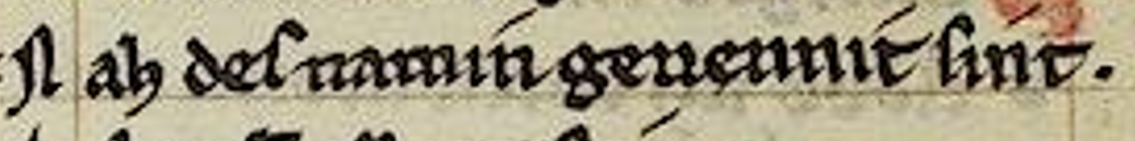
Nah deſ namin genennit ſint.
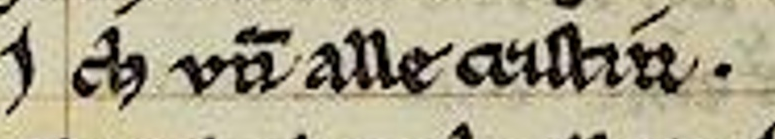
Ich vn(d) alle criſtin.
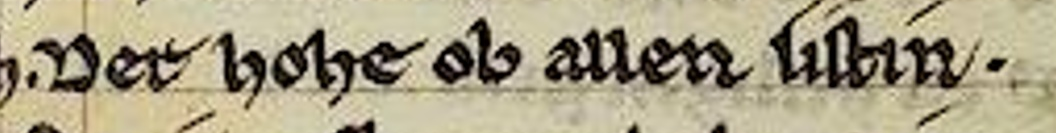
Der hohe ob allen liſtin.
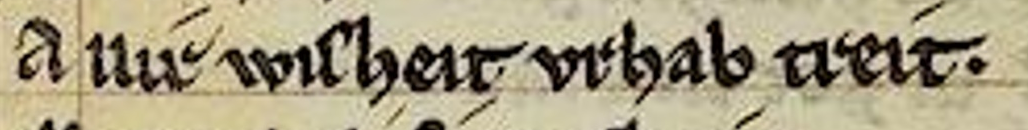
Allir wiſheit vrhab treit.
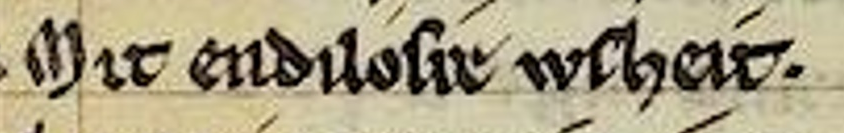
Mit endiloſir wſheit.
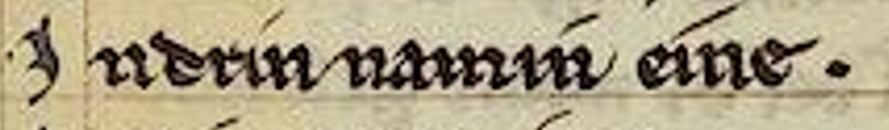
Indrin namin eine.
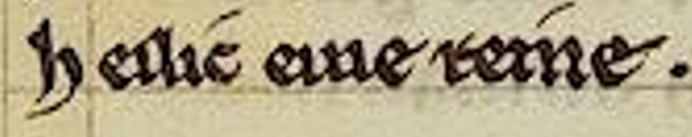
Heilic eine reine.
